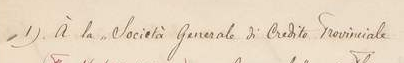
1). À la «Società Generale di Credito Provinciale
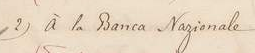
2). À la Banca Nazionale
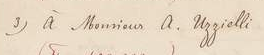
3). À Monsieur A. Uzzielli
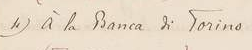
5). À Messieurs U. Geisser
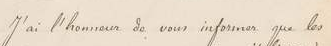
J'ai l'honneur de vous informer que les
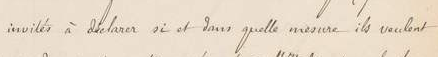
invités à déclarer si et dans quelle mesure ils veulent
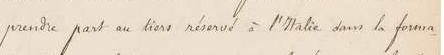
prendre part au tiers réservé à l'Italie dans la forma-
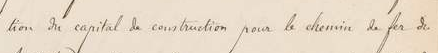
tion du capital de construction pur le chemin de fer du
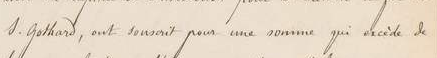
S. Gothard, ont souscrit pour une somme qui excède de
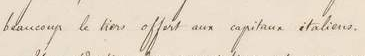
beaucoup le tiers offert aux capitaux italiens.
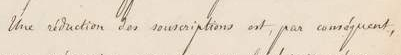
Une réduction des souscriptions est, par conséquent,
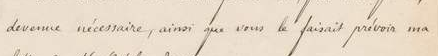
devenue nécessaire, ainsi que vous le faisait prévoir ma
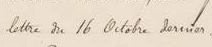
lettre du 16 Octobre dernier.
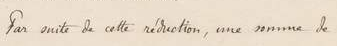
Par suite de cette réduction, une somme de
